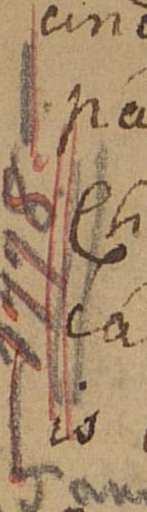1778
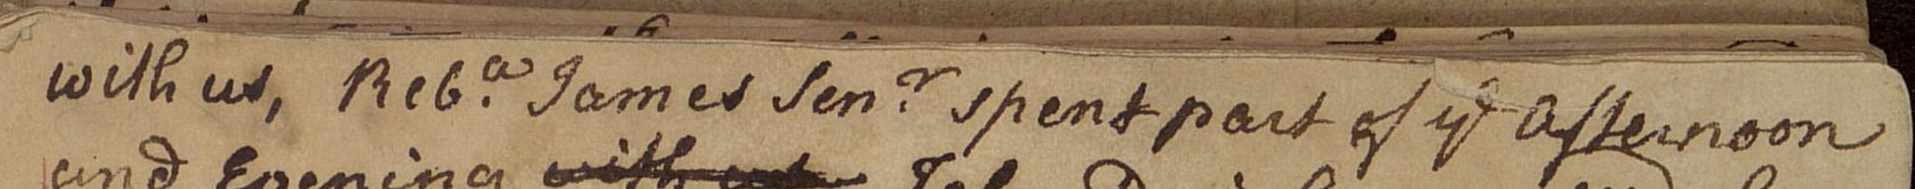with us, Reb^a. James Sen^r. spent part of y^e Afternoon
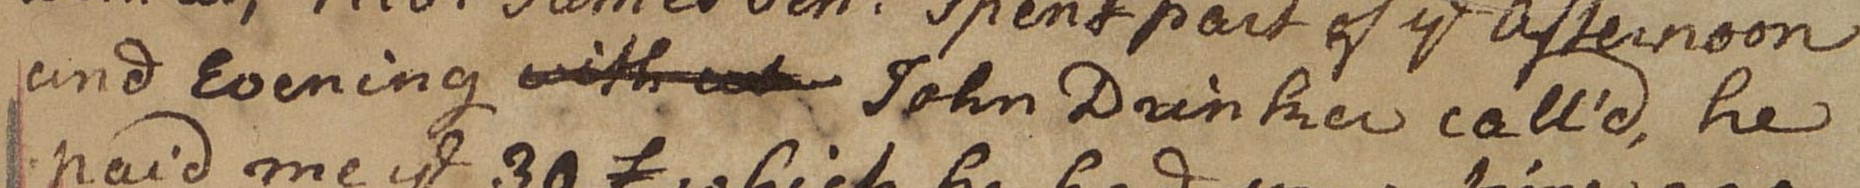and Evening [with us] John Drinker call'd, he
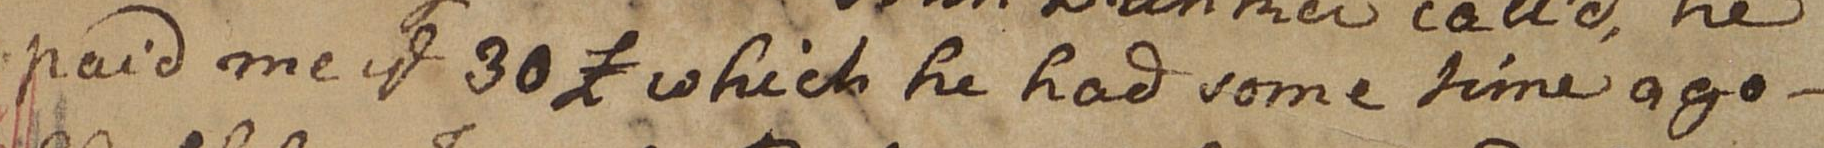paid me y^e 30 £ which he had some time ago-
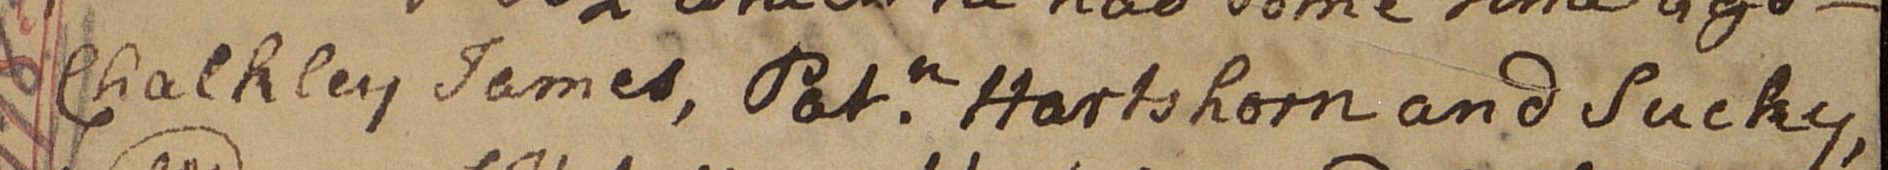Chalkley James, Pat^k. Hartshorn and Sucky,
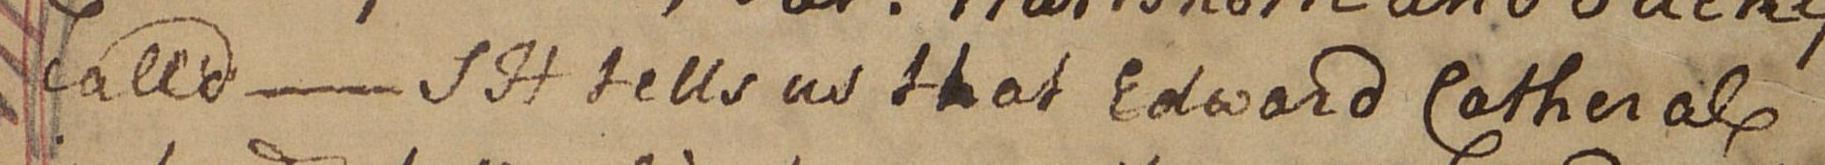call'd- SH tells us that Edward Catheral
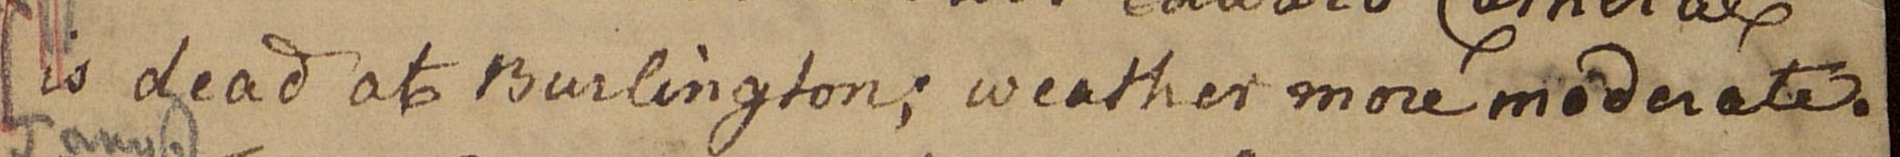is dead at Burlington; weather more moderate.
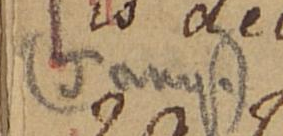(Jany.)
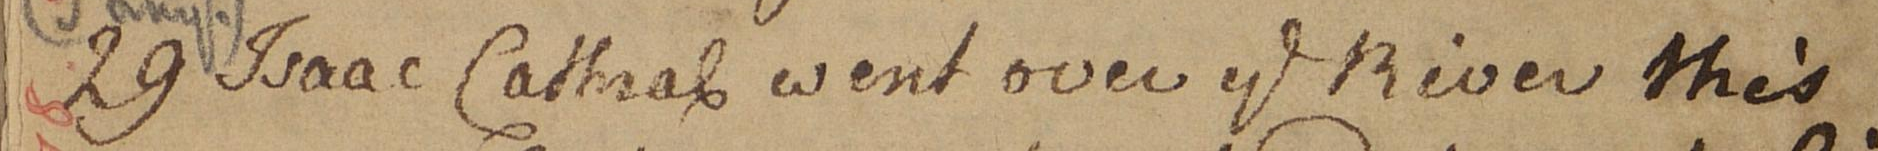29 Isaac Cathral went over y^e River this
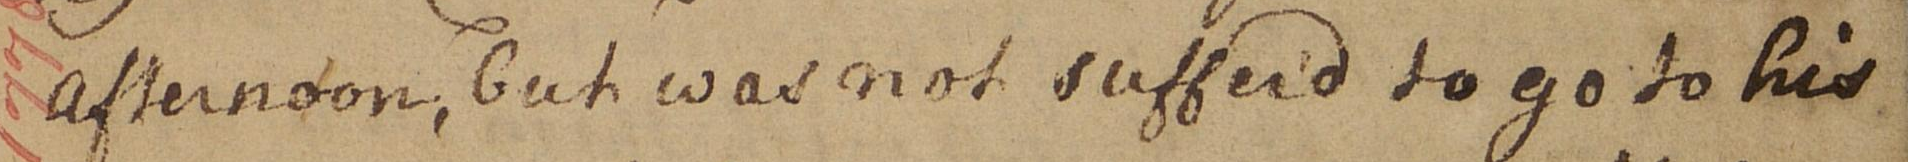Afternoon, but was not suffer'd to go to his
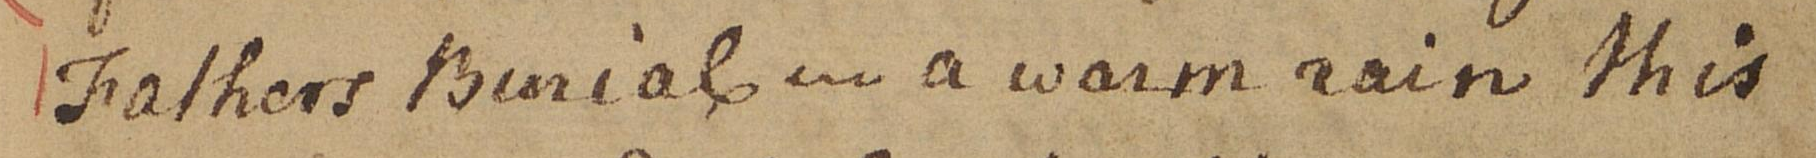Fathers Burial- a warm rain this
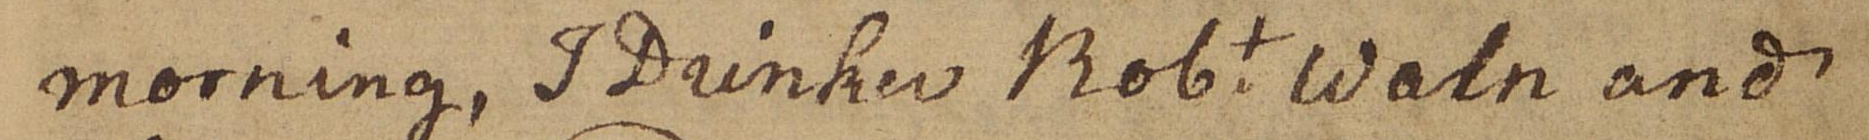morning, J Drinker Rob^t. Waln and
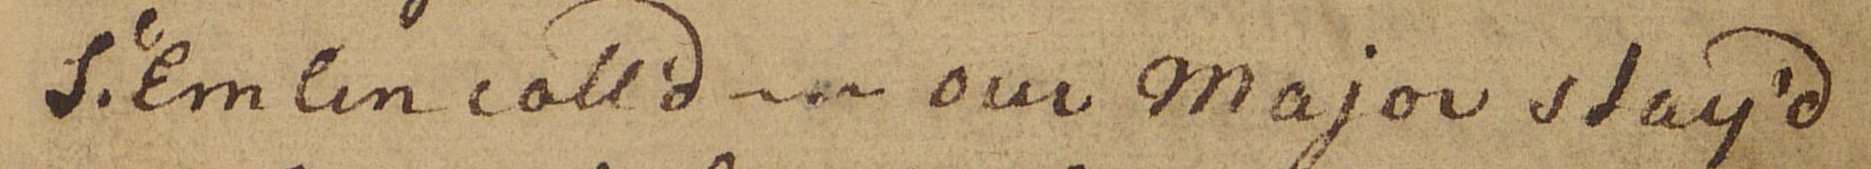S^l. Emlen call'd- our Major stay'd
